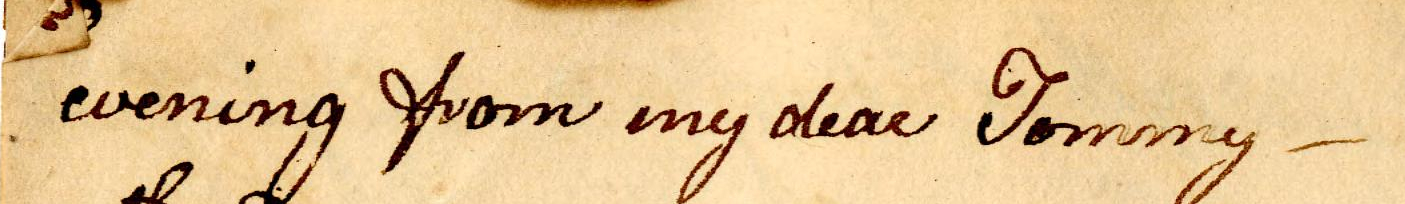evening from my dear Tommy-
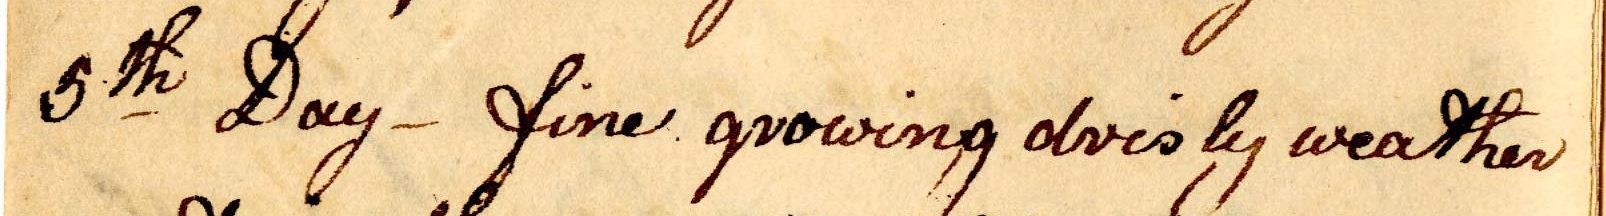5^th Day- fine growing drisly weather
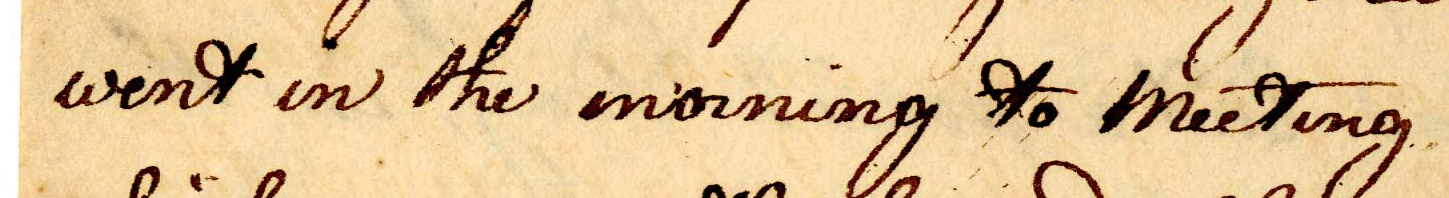went in the morning to Meeting
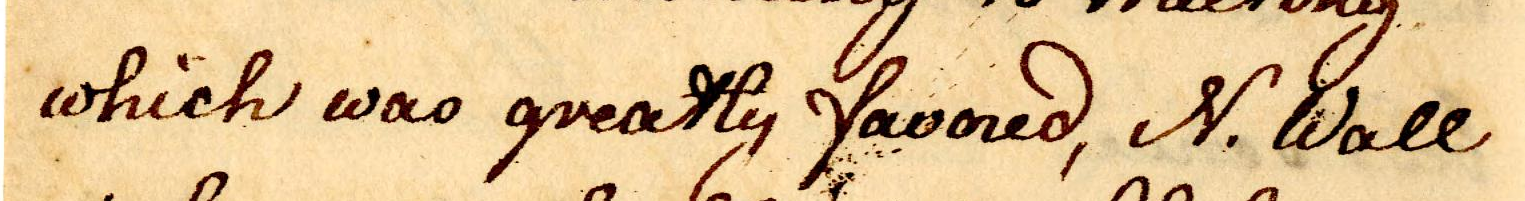which was greatly favored, N. Wall
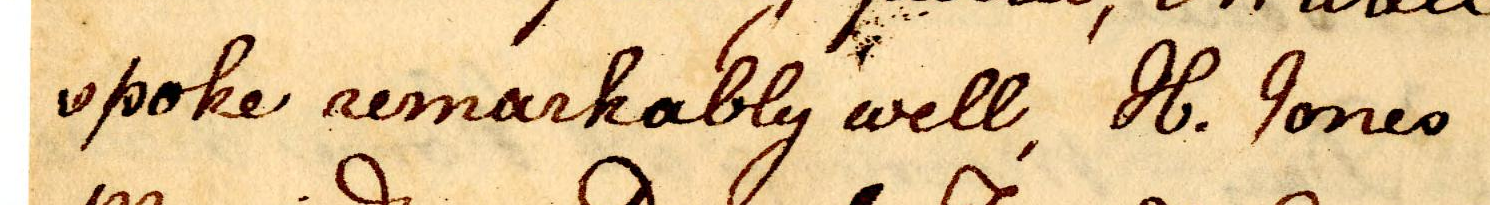spoke remarkably well, H. Jones
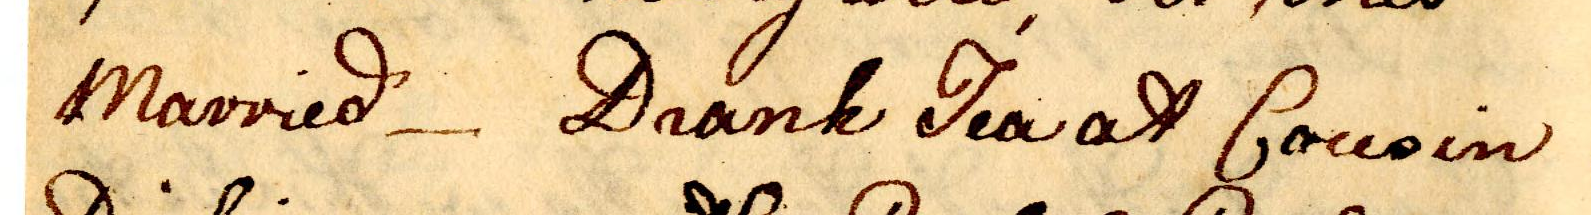Married- Drank Tea at Cousin
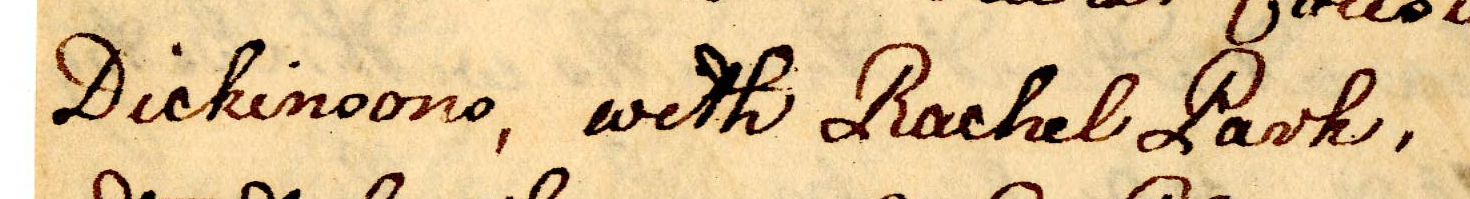Dickinsons, with Rachel Park,
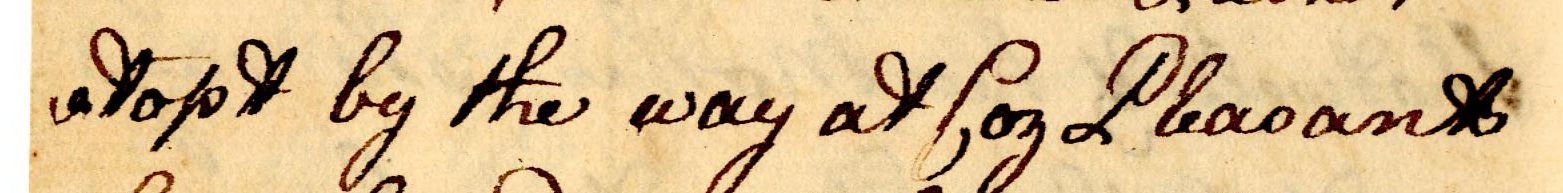stopt by the way at Coz Pleasants
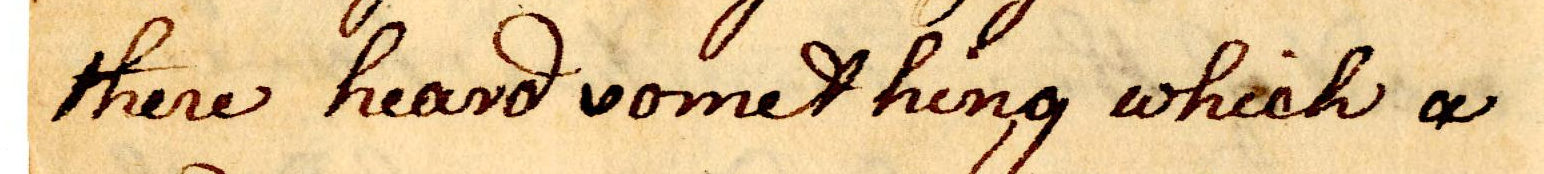there heard something which a
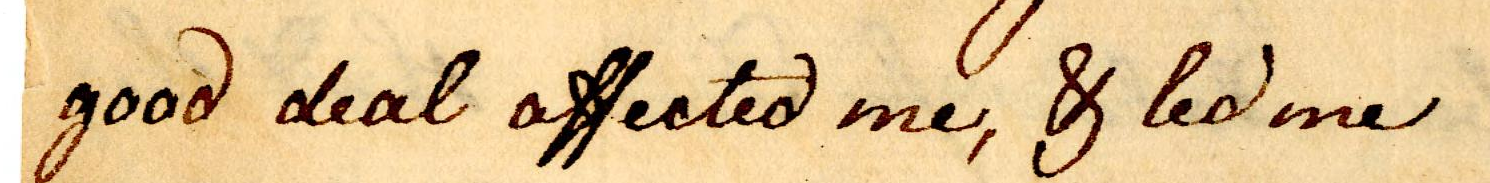good deal affected me, & led me
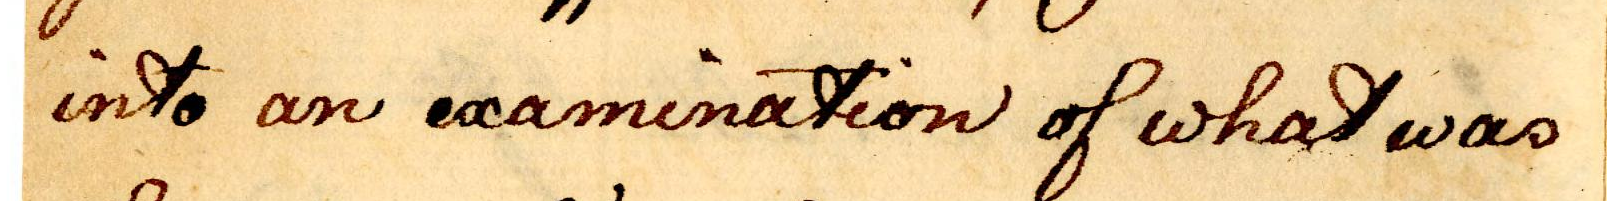into an examination of what was
